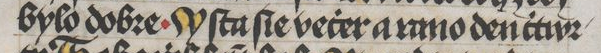bylo dobre.Y ſta ſie veċer a rano den ċtwr¬
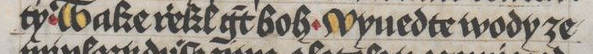ty.Take ṙekl ḡt boh.Vyuedte wody ze¬
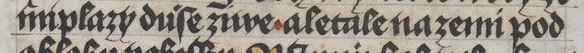míplazy duẛe zíwe.aletale na zemi pod
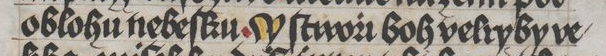oblohu nebeſku.Y ſtwoṙi boh velryby ve¬
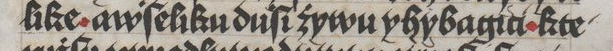like.awẛeliku duẛí żywu yhybagití.kte¬
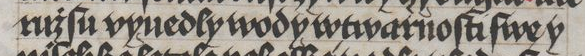ruż ſu vyuedly wody wtwarnoſtí ſwe y
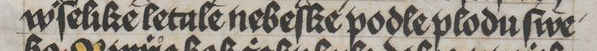wẛelike letale nebeſké podle plodu ſwe¬
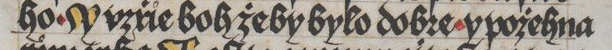ho.Y vzṙie boh żeby bylo dobre.y pożehna
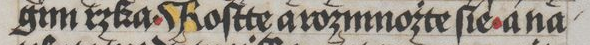gim rzka.Roſtte a rozmnożte ſie.a na¬
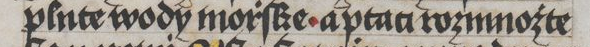plnte wody moṙſke.a ptaci rozmnożte
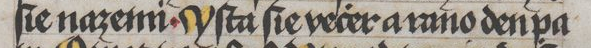ſie nazemi.Y ſta ſie veċer a rano den pa¬
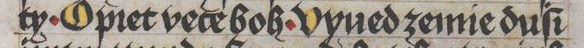ty. Opiet vece boh. Vyued zemie duẛi
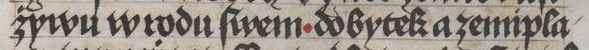żywu w rodu ſwem. dobytek a zemípla¬
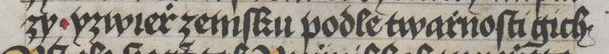zy.yzwieṙ zemſku podle twaṙnoſtí gích
